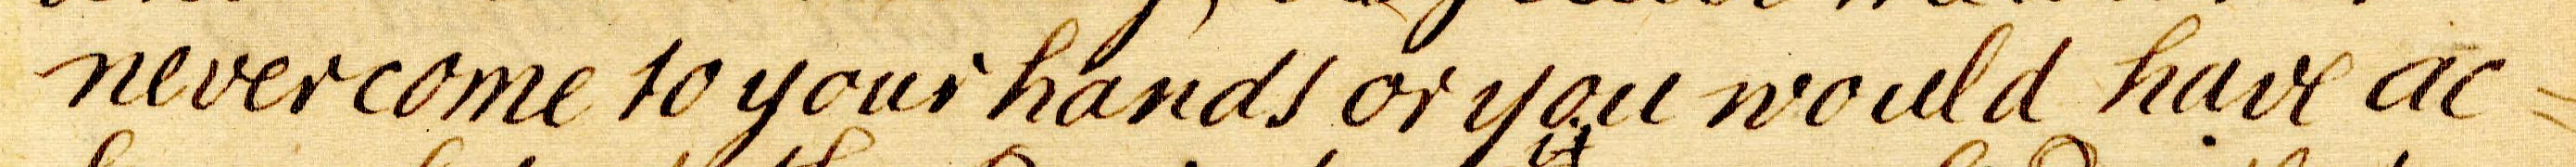never come to your hands or you would have ac-
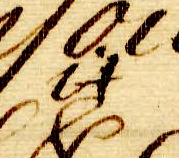it
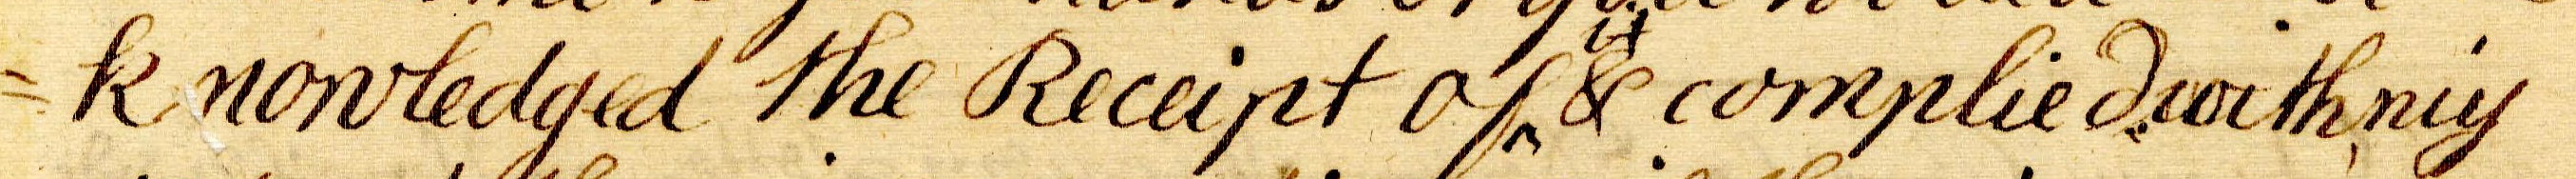-knowledged the Receipt of ^ & complied with niy
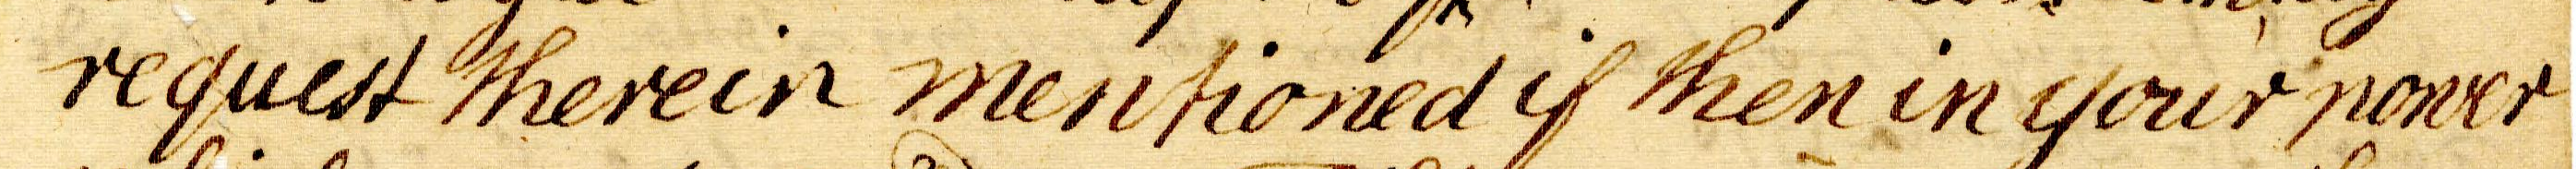request therein mentioned if then in your power
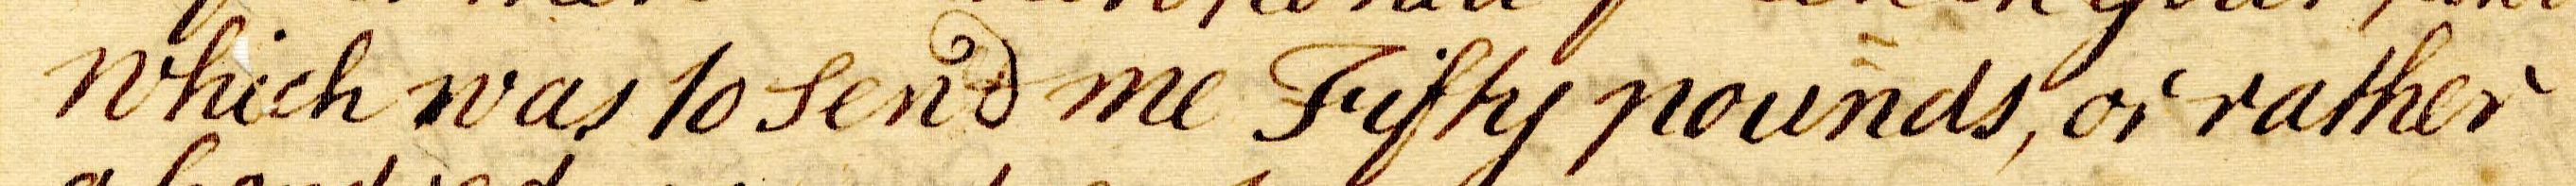which was to send me Fifty pounds, or rather
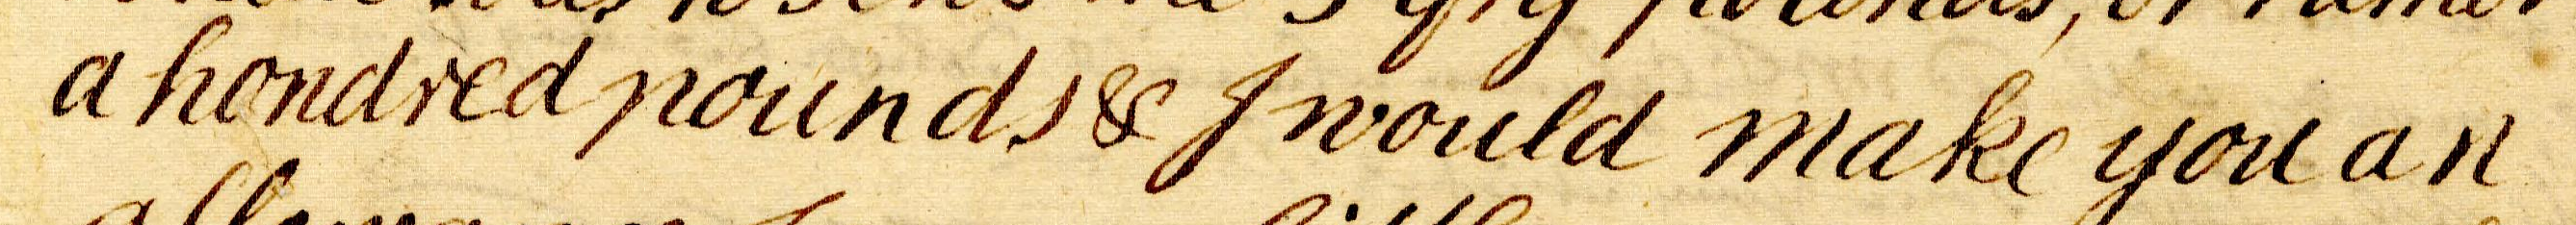a hundred pounds & I would make you an
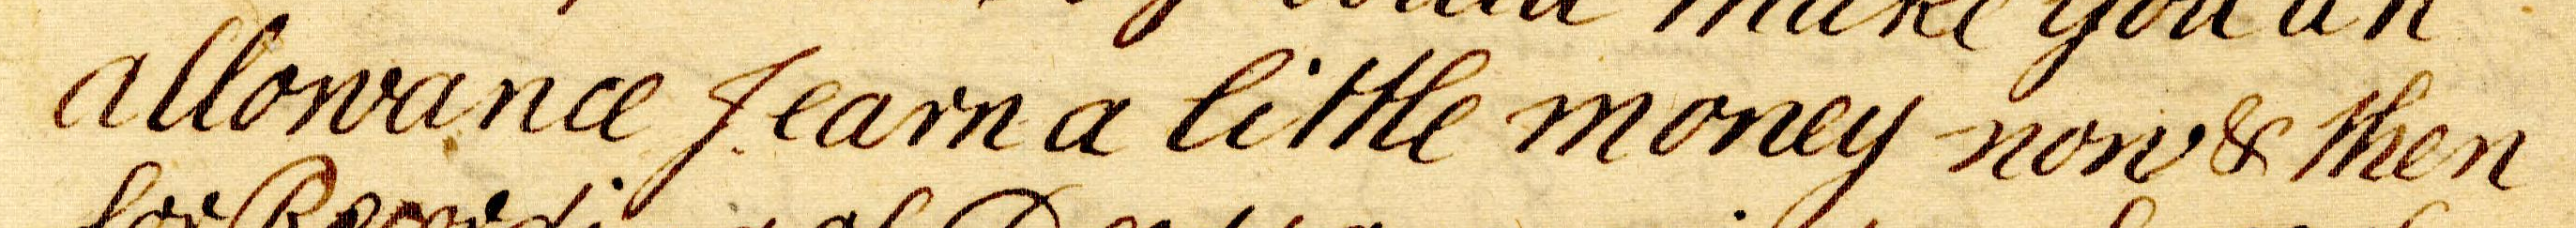Allowance I earn a little money now & then
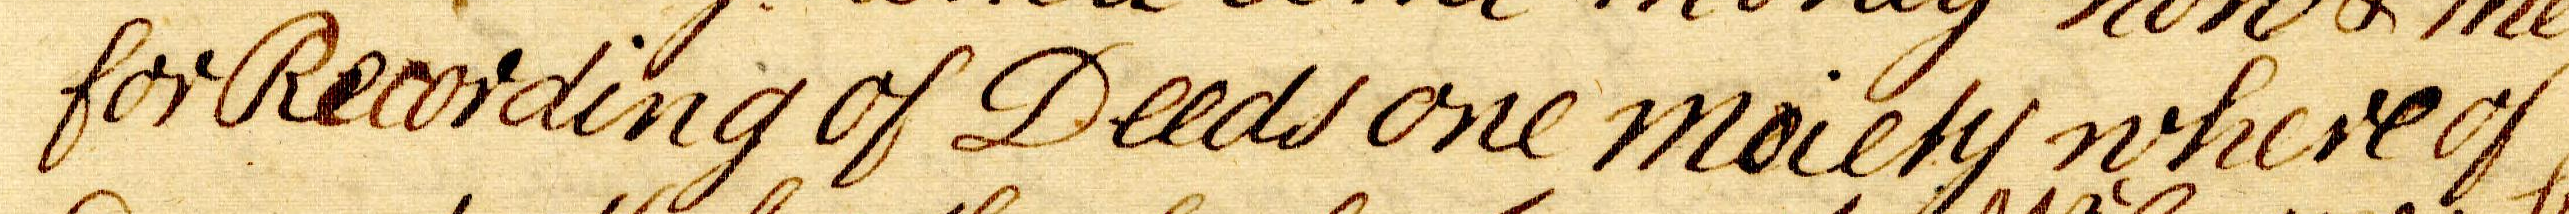for Recording of Deeds one moiety whereof
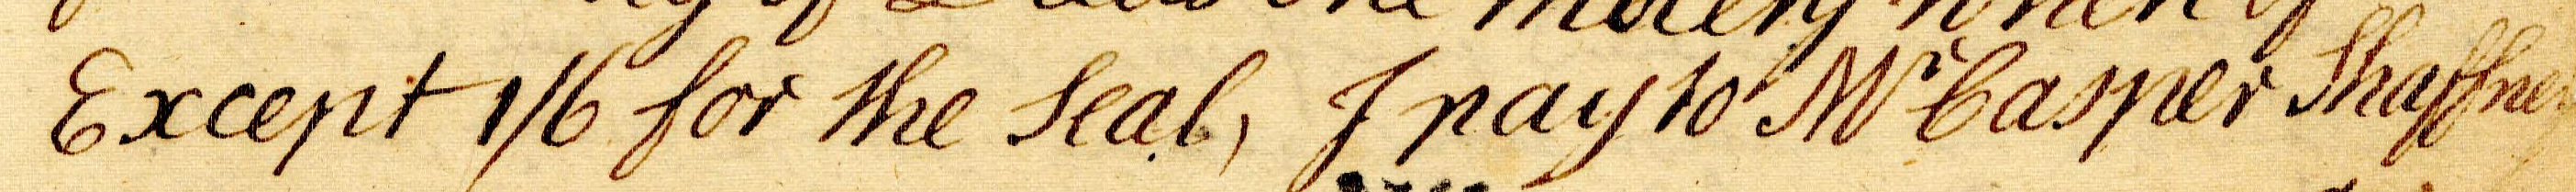Except 1/6 for the Seal, I pay to M^r Casper Shaffner
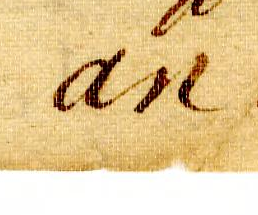an
